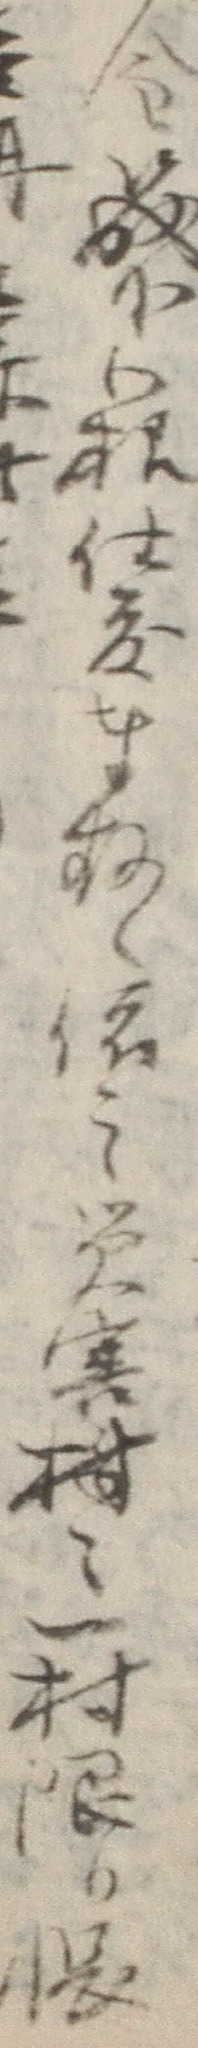金被成下候様仕度奉存候依之災害村々一村限り帳
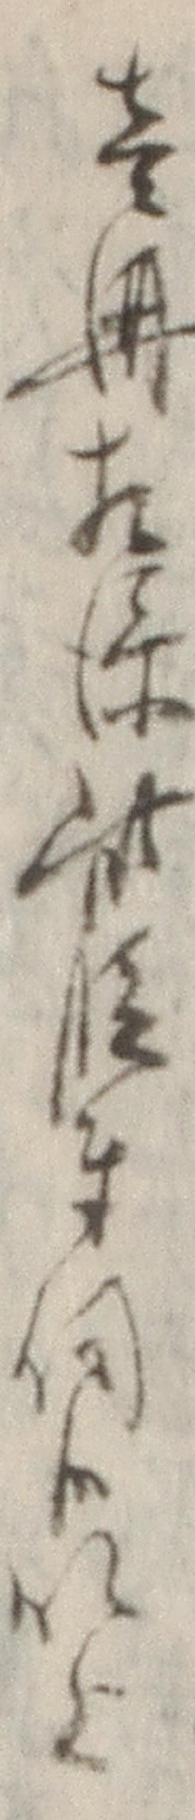壱冊相添此段奉伺候以上
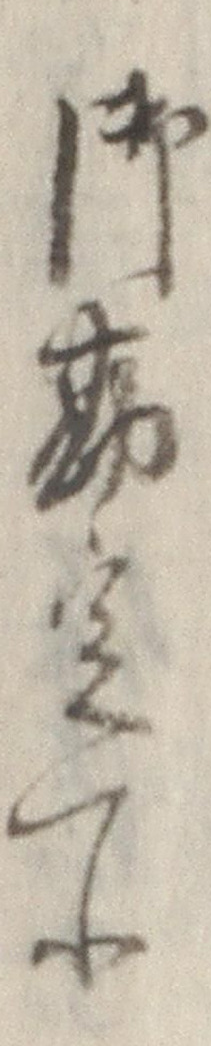御勘定所
